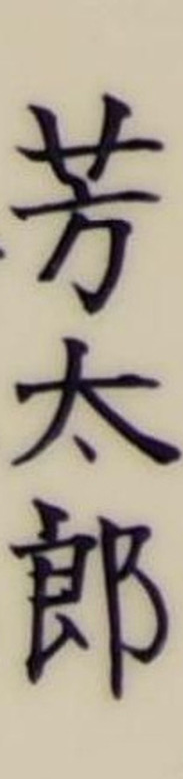芳太郎
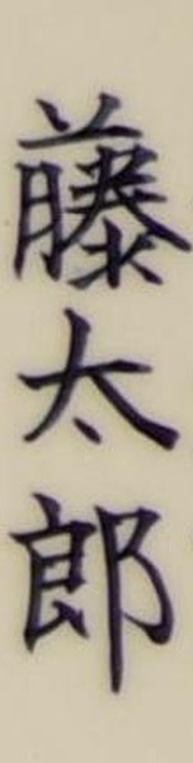藤太郎
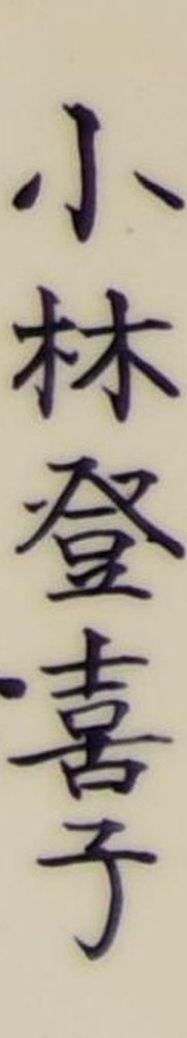小林登喜子
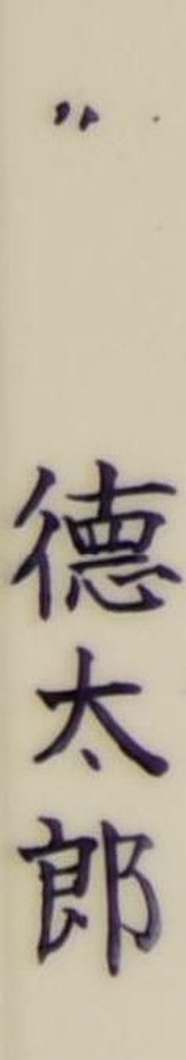徳太郎
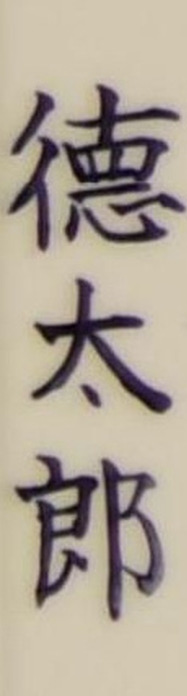徳太郎

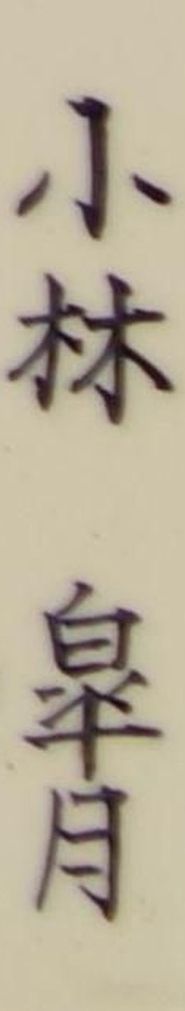小林皐月
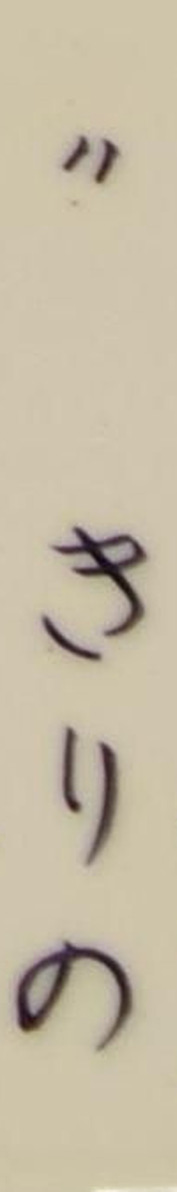きりの
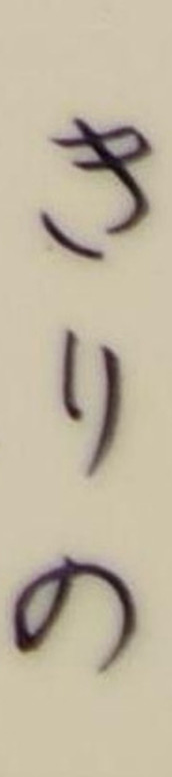きりの
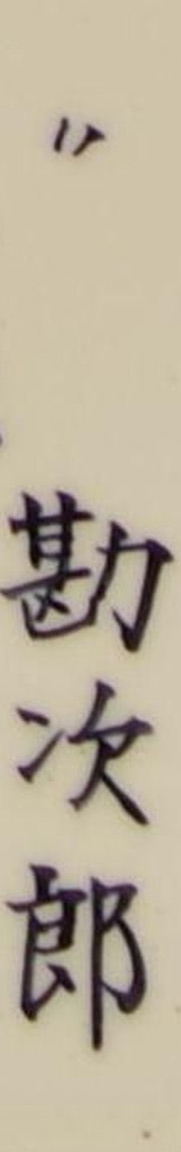勘次郎
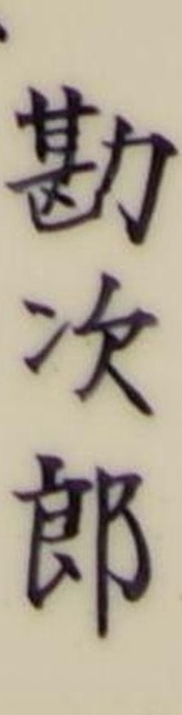勘次郎
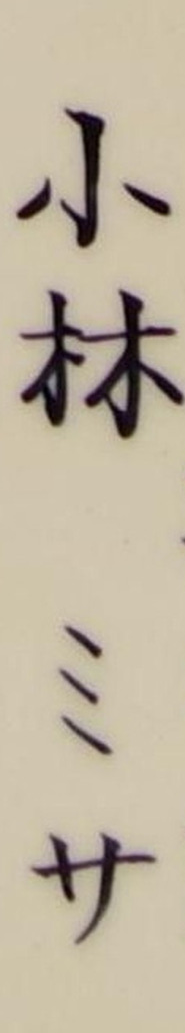小林ミサ
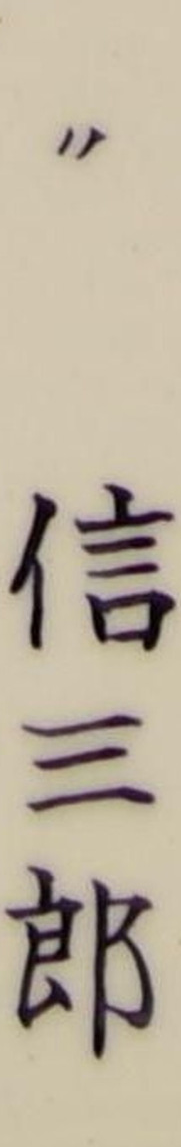信三郎
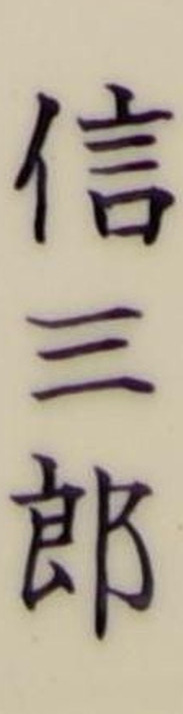信三郎
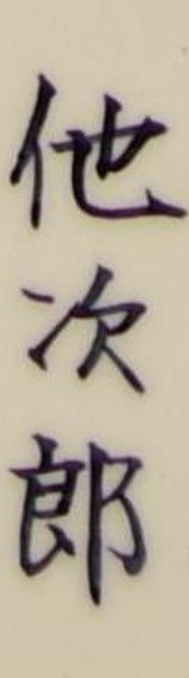他次郎
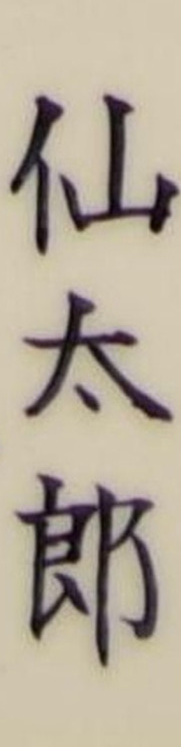仙太郎
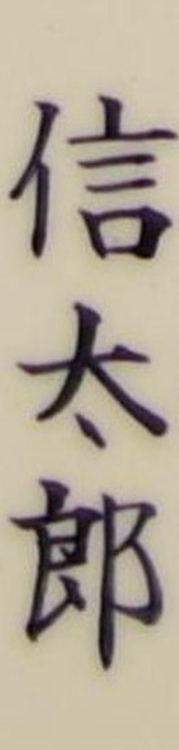信太郎
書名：A~D
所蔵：koyasan kongobuji
